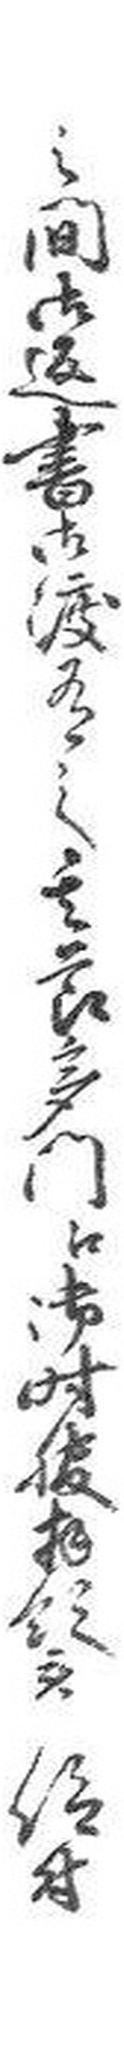之間御返書御渡有之其節多門江御時服拝領被仰付
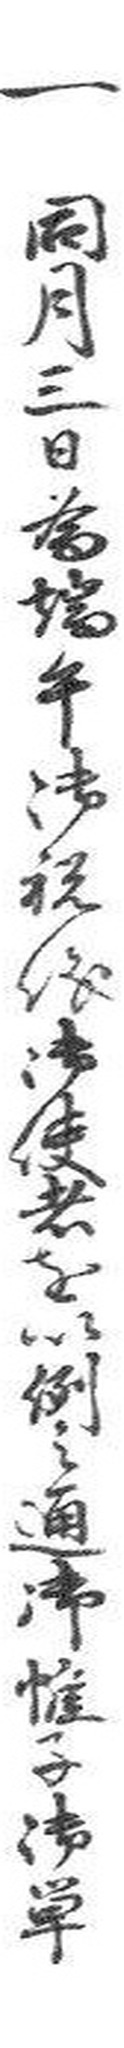一同月三日為端午御祝儀御使者を以例之通御帷子御単
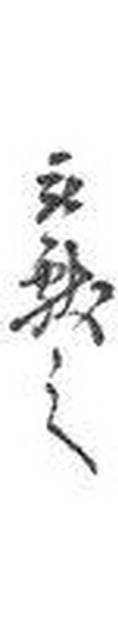被献之
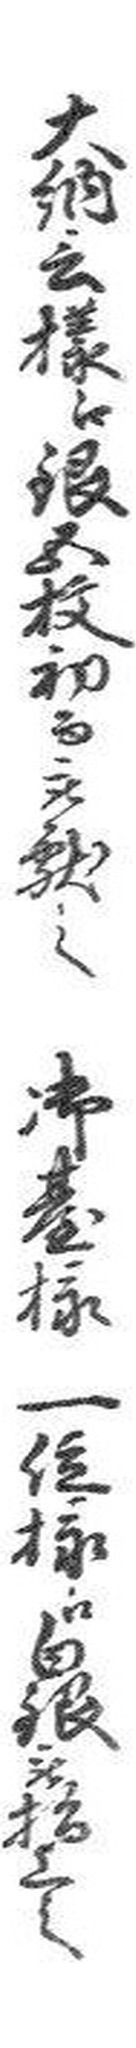大納言様江銀五枚初而被献之御台様一位様江白銀被指上之
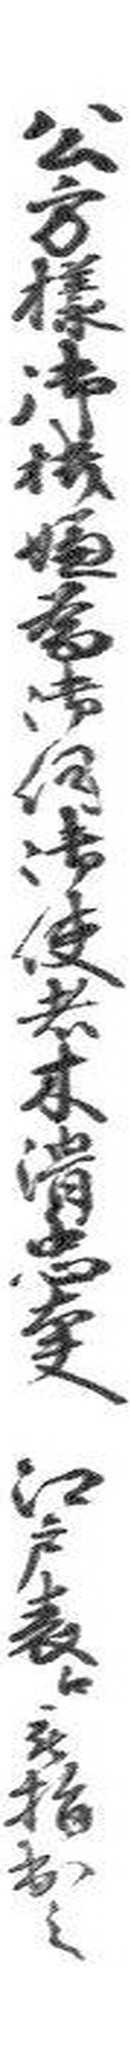公方様御機嫌為御伺御使者木滑忠太夫江戸表江被指出之
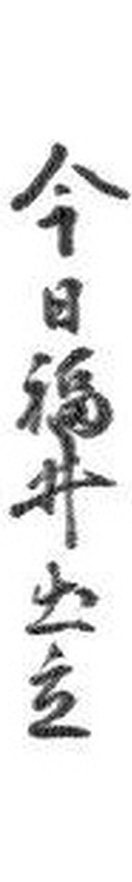今日福井出立
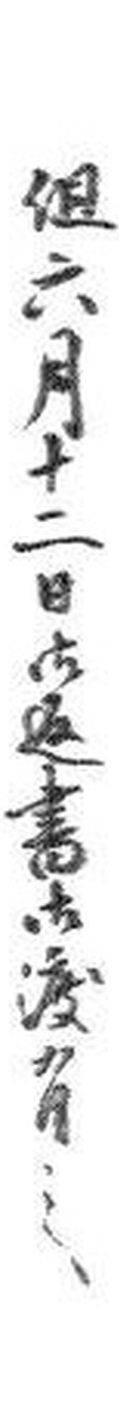但六月十二日御返書御渡有之
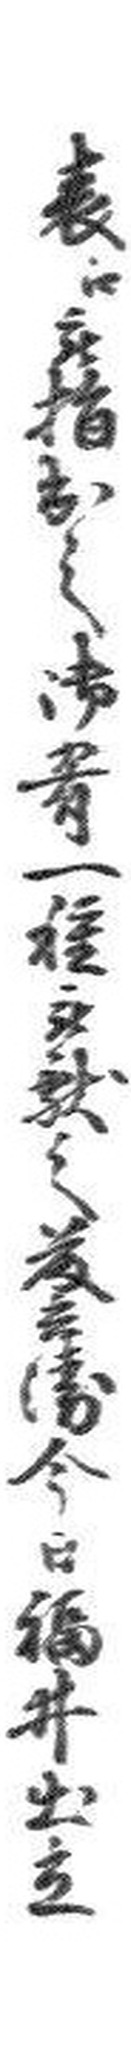表江被指出之御肴一種被献之藤兵衛今日福井出立
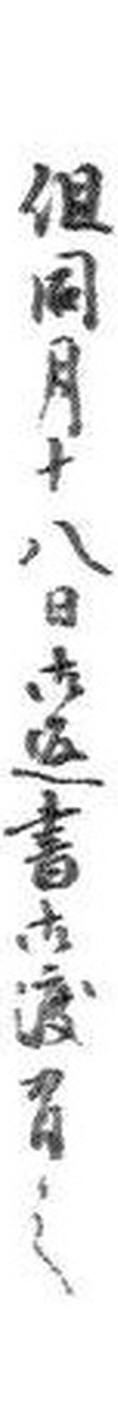但同月十八日御返書御渡有之
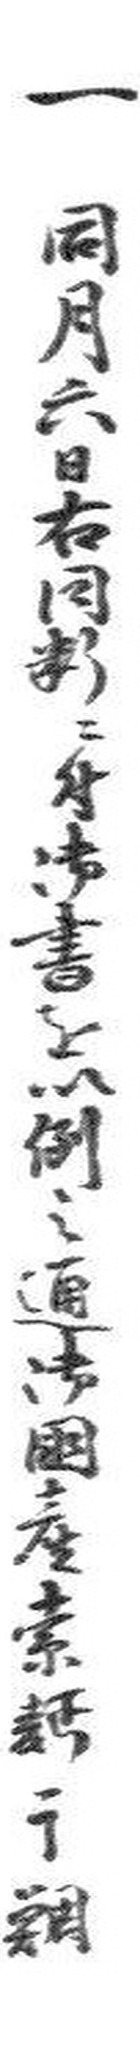一同月六日右同断ニ付御書を以例之通御国産素麺干鯛
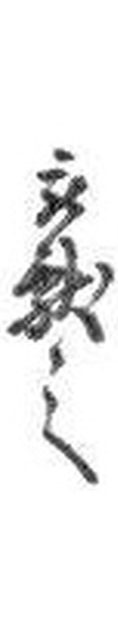被献之
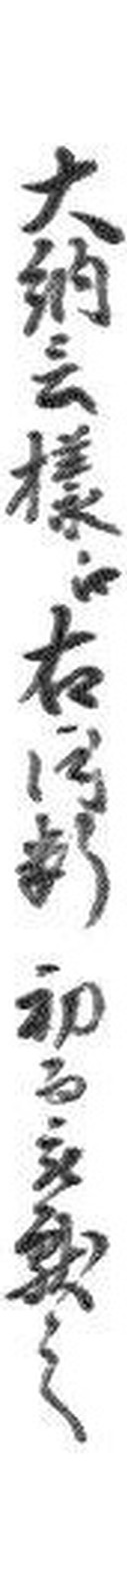大納言様江右同断初而被献之
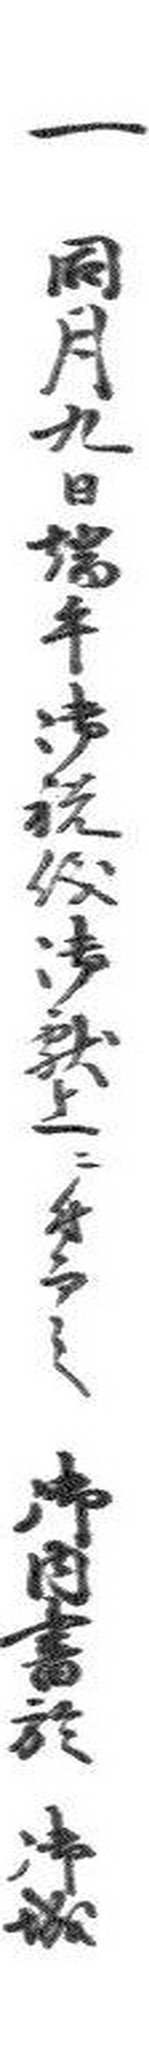一同月九日端午御祝儀御献上ニ付而之御内書於御城
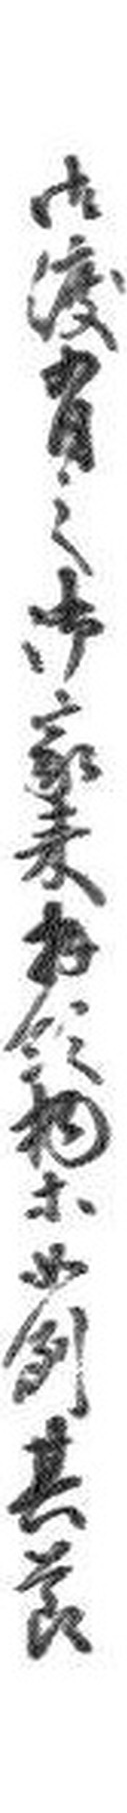御渡有之御家来拝領物等如例其節

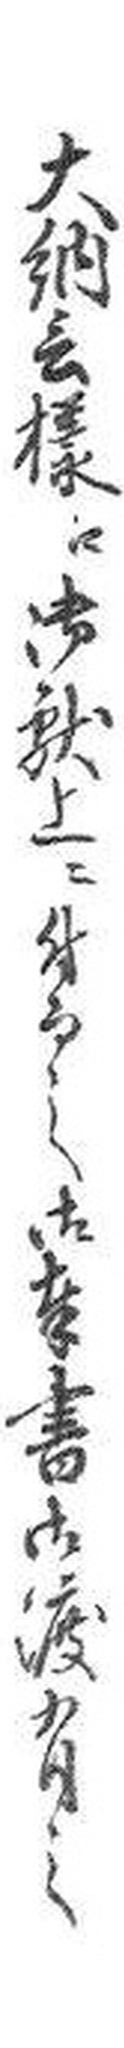大納言様江御献上ニ付而之御奉書御渡有之
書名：家譜 二十三 吉品公 従宝永元年到同二年
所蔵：福井県文書館 Fukui Prefectural Archives
